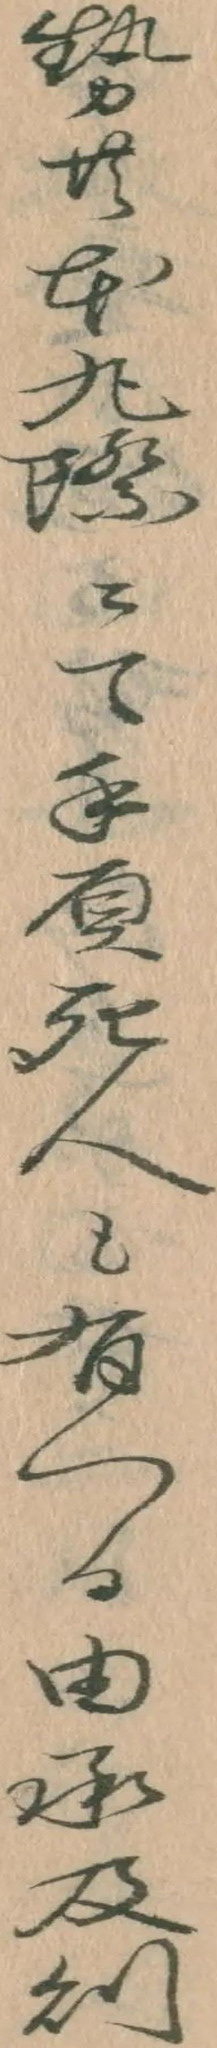勢共本丸際にて手負死人も有つる由承及則
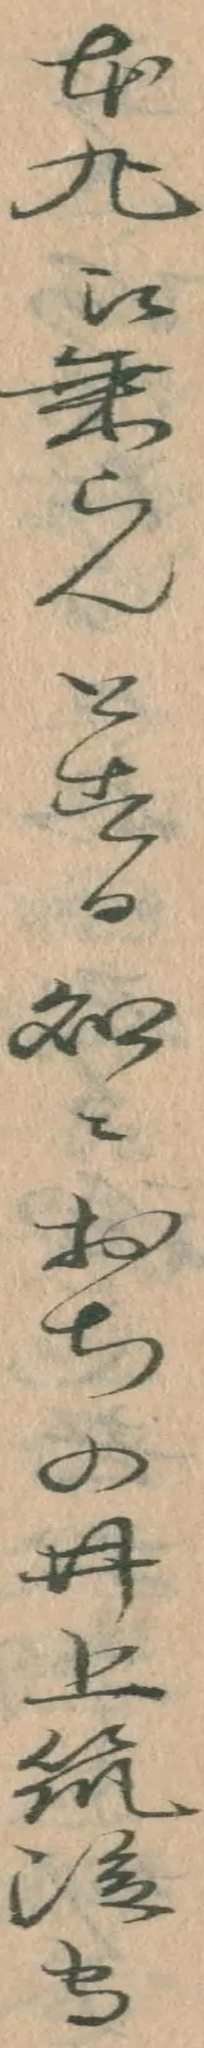本丸江乗らんと春る処におちの井上筑後守
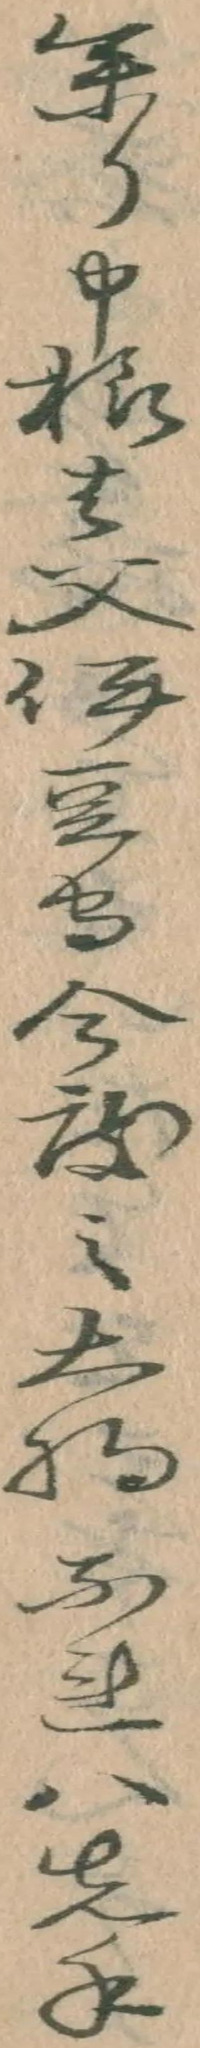参り申様者父伊豆守今度之大将な連は先手
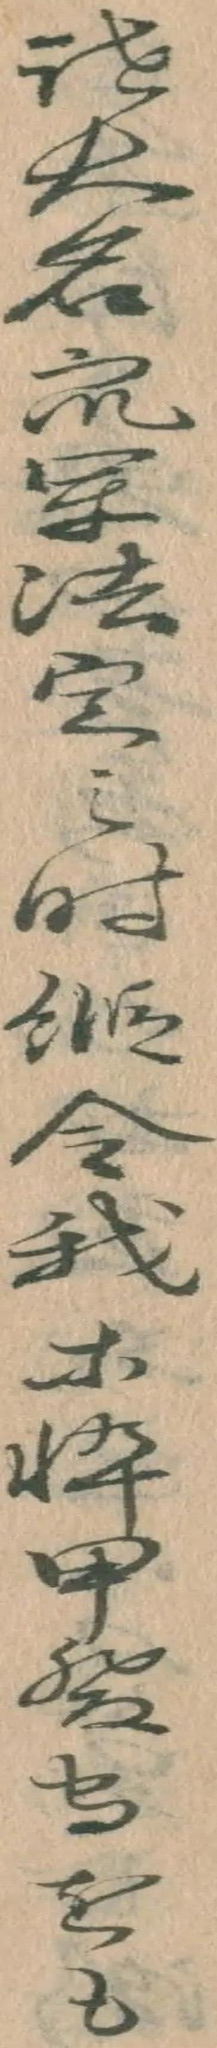諸大名衆軍法定之時縦令我等忰甲斐守をも
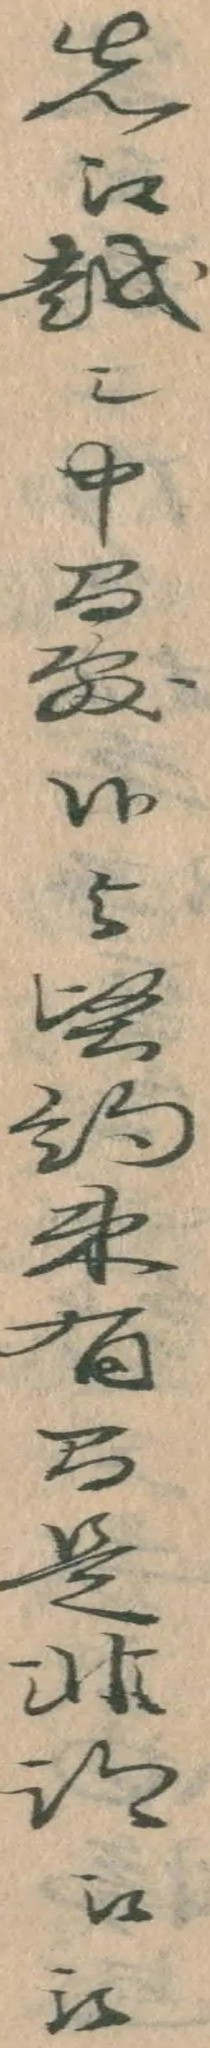先江越し申間敷候与堅約束有間是非跡江被
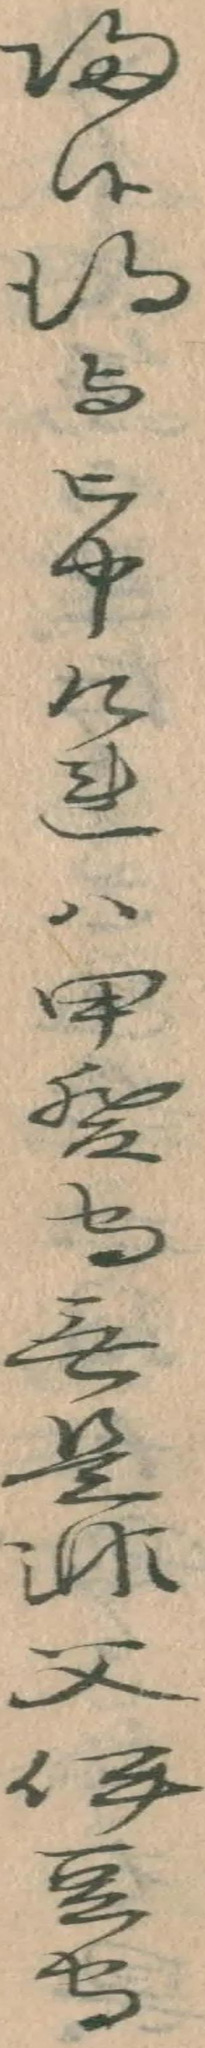帰候得与被申け連は甲斐守無是非父伊豆守
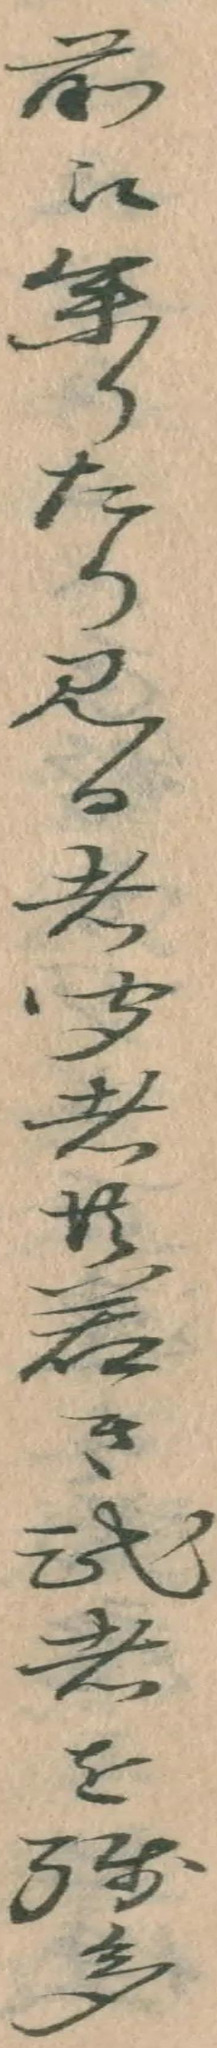前江参りたり見る者聞者共若き武者を残多
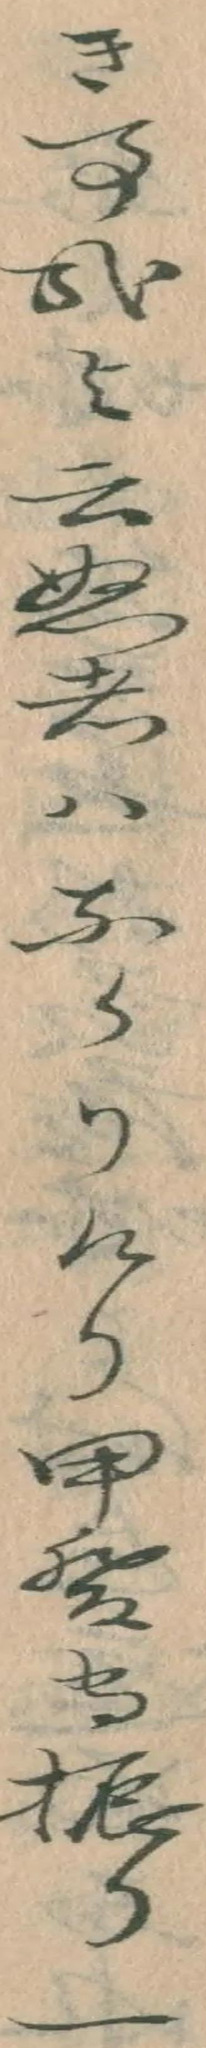き事哉与云怒者はなかりけり甲斐守振り一
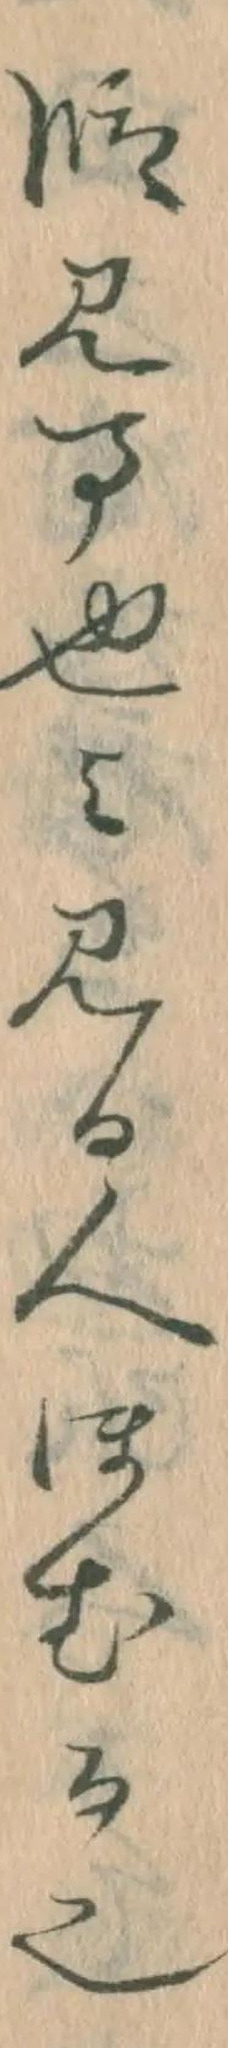段見事也与見る人ほむる也
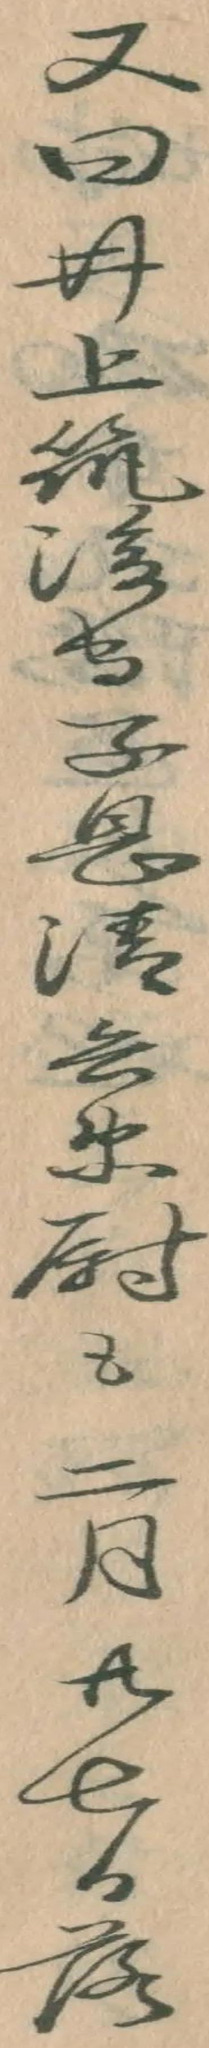又曰井上筑後守子息清兵衛尉も二月廿七日落

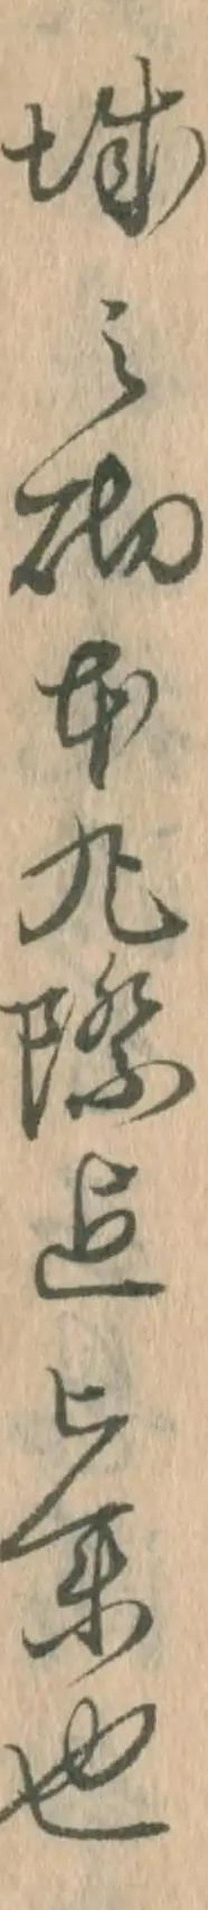城之砌本丸際迄被参也
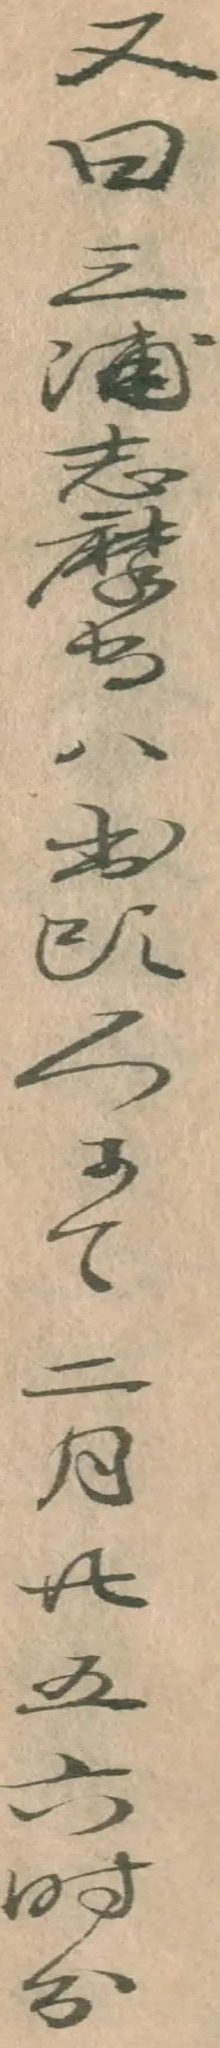又曰三浦志摩守は出頭人尓て二月廿五六時分
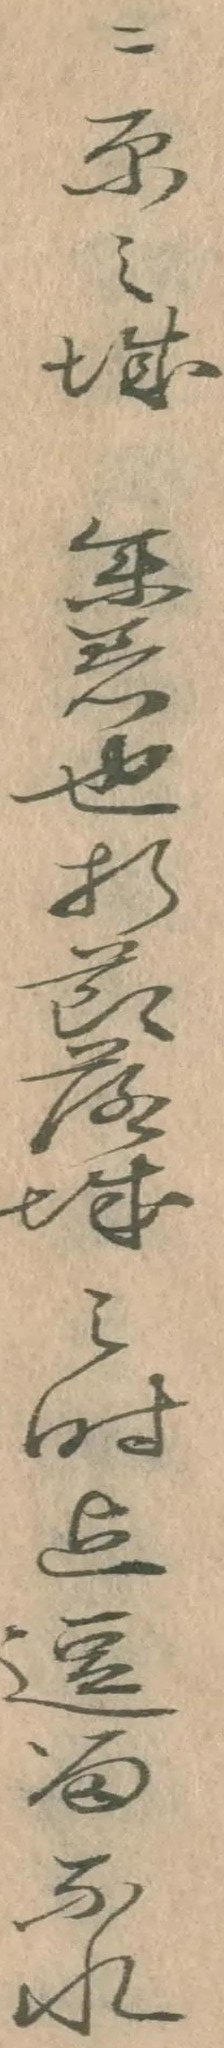に原之城参着也折節落城之時迄逗留なれ
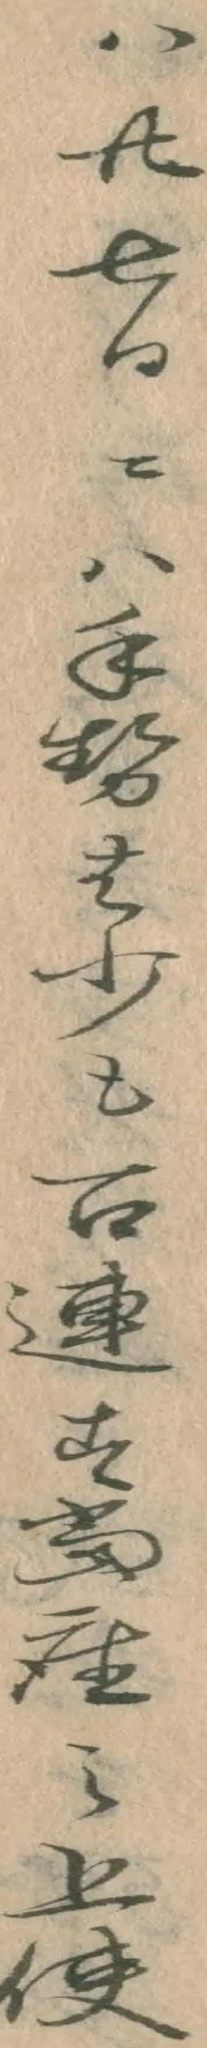は廿七日には手勢者少も召連春当座之上使
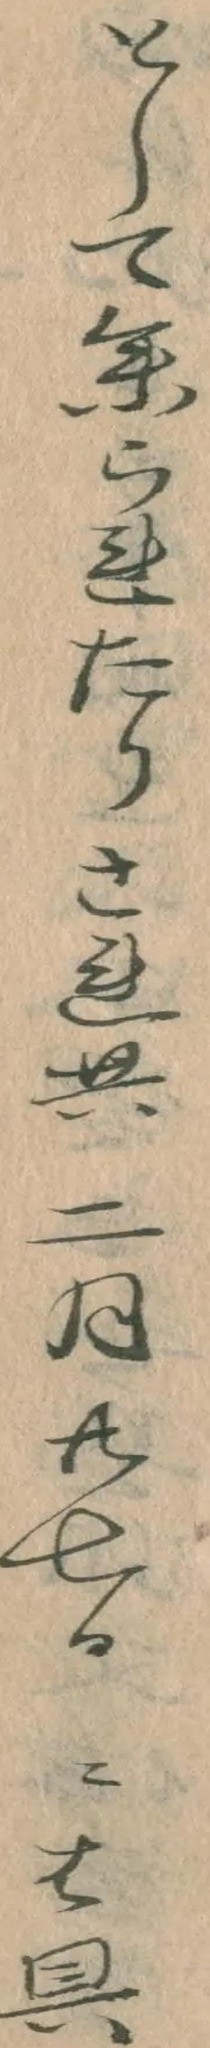として参ら連たりさ連共二月廿七日に者具
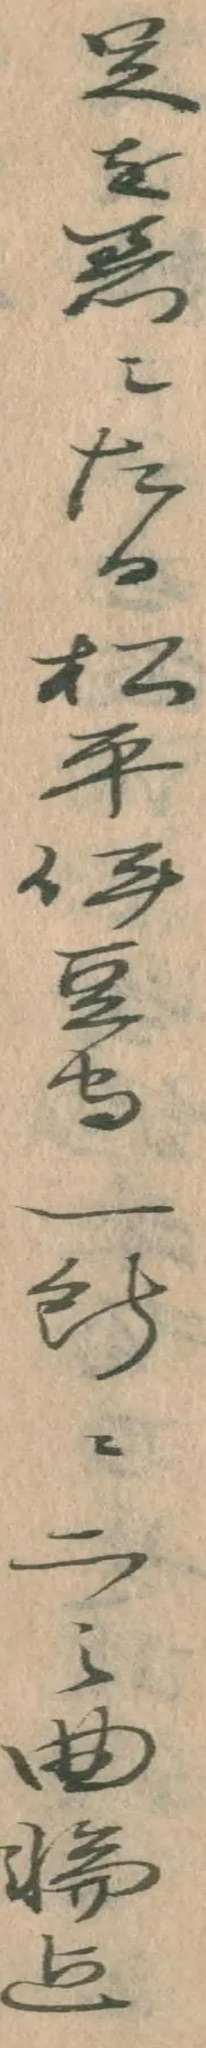即を着したる松平伊豆守一所に二之曲輪迄
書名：切支丹御退治記 49巻. [8]
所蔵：国立国会図書館 National Diet Library, JAPAN
